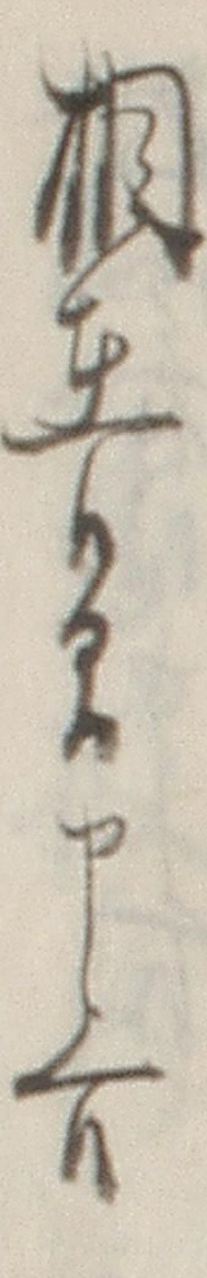相在候間申上候
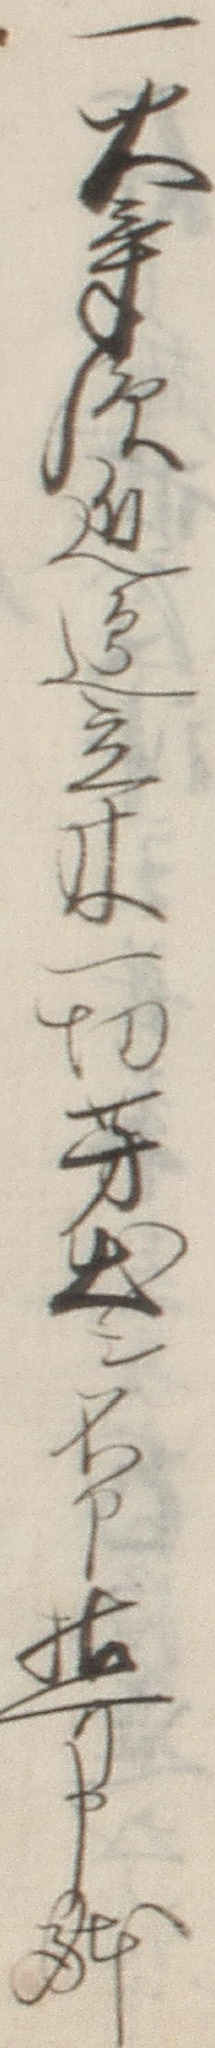一大気強近辺立木一切芽出シ不申居可申躰
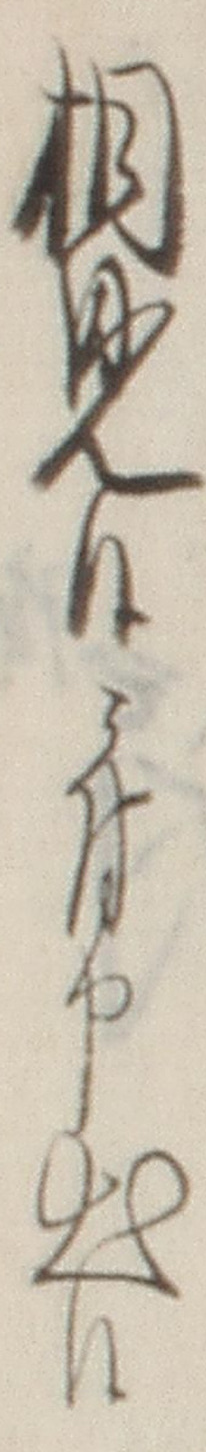相見候ニ付申出候

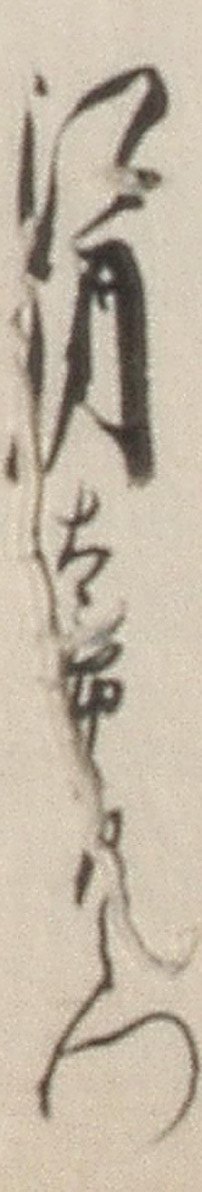戌江川太郎左衛門
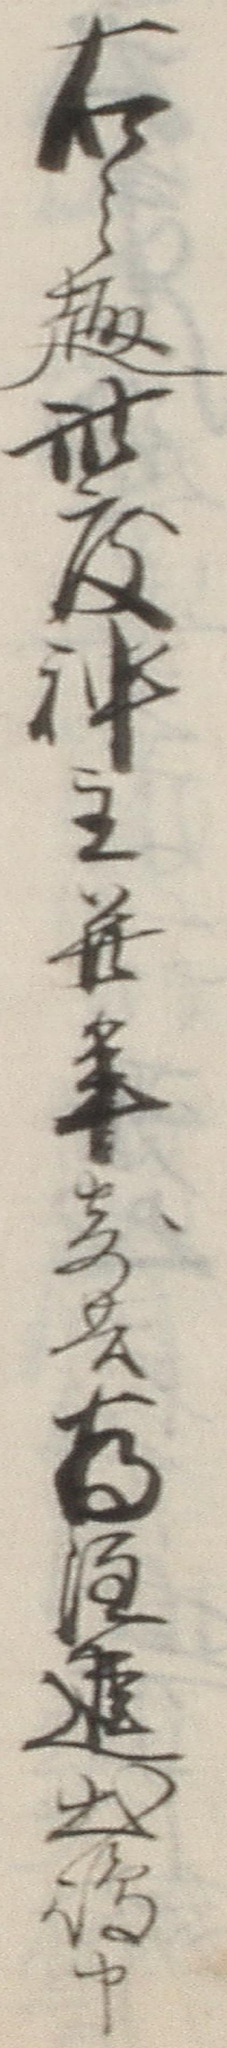右之趣此度神主并年寄共為注進出嶋申
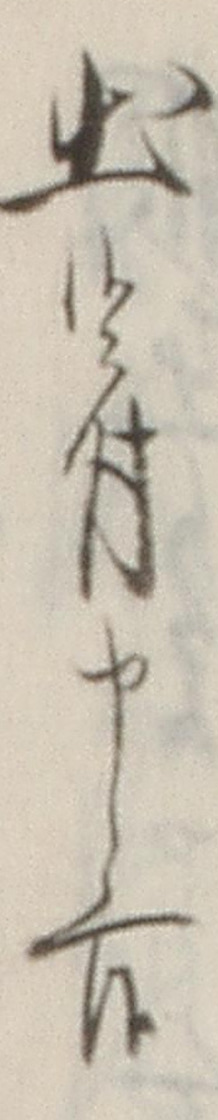出候ニ付申上候
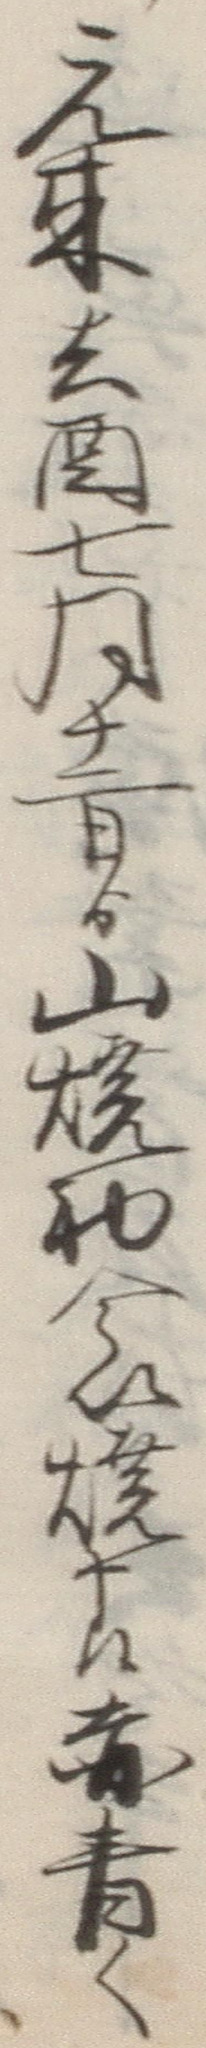元来去酉七月十二日ゟ山焼初今以焼申候赤青く
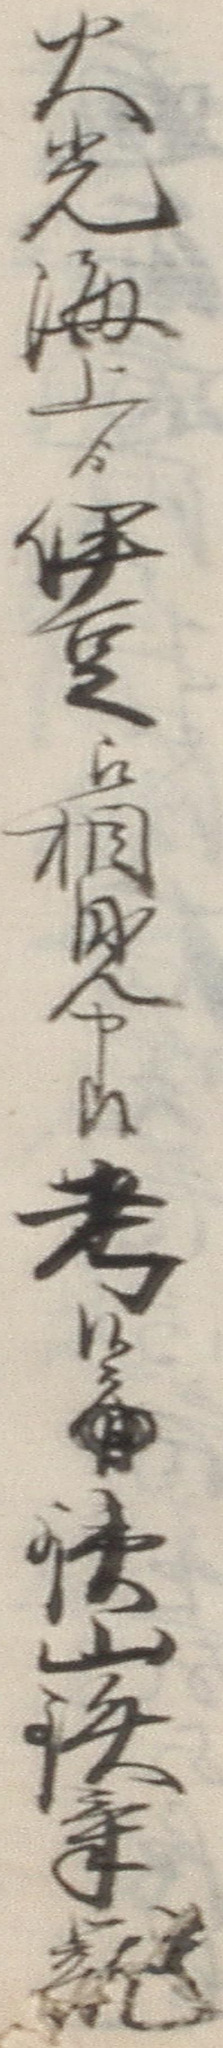大光海上ゟ伊豆え相見申候考候ニ鉄山鉄気趣
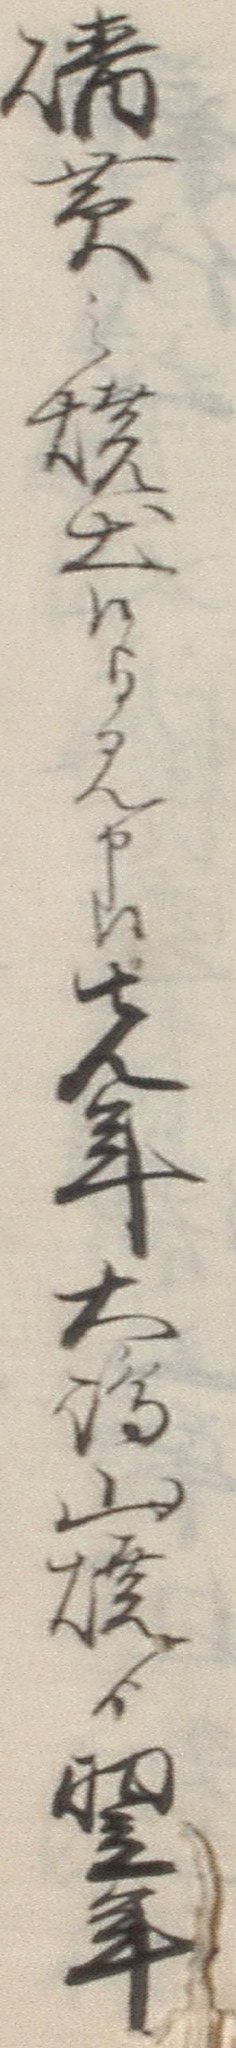倩黄之焼出候と見申候先年大嶋山焼ゟ翌年
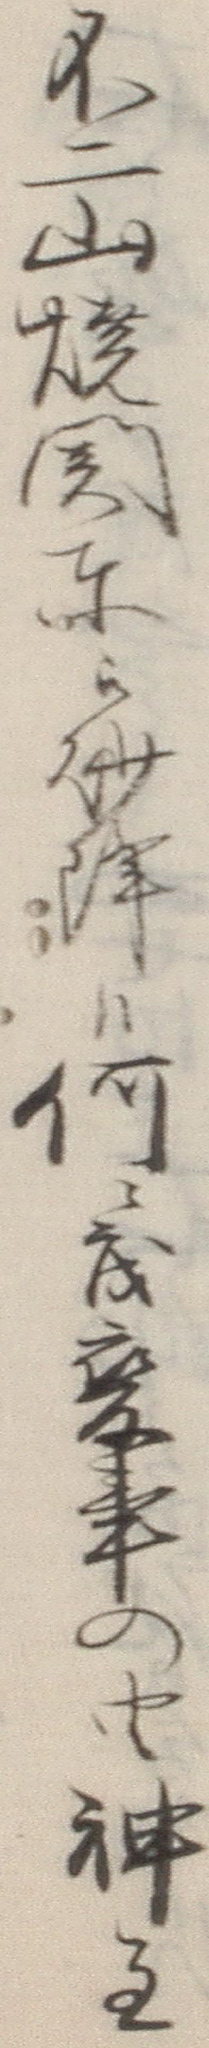不二山焼関東江砂降候何ニも変事の由神主
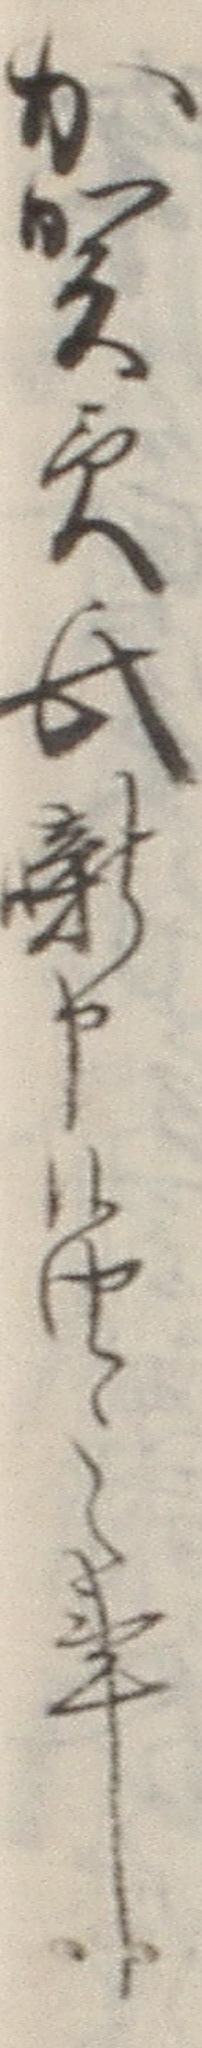加賀美氏噺申候由之事
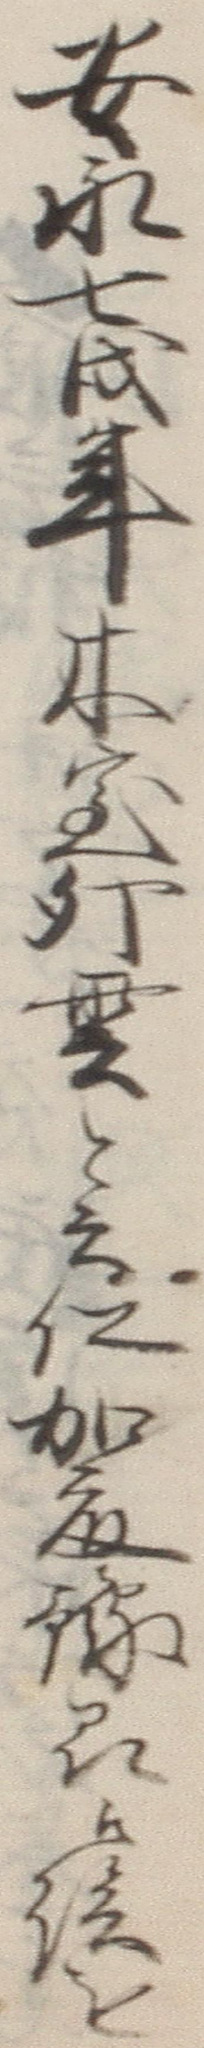安永七戌年木宝外貫ところに加藤豫州え絵を
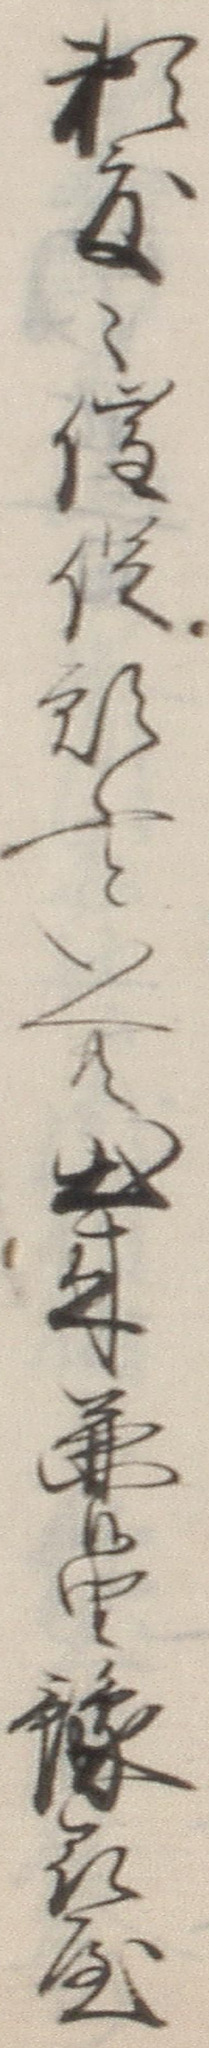数度之催促願ふといへ共出来兼候由豫州屋
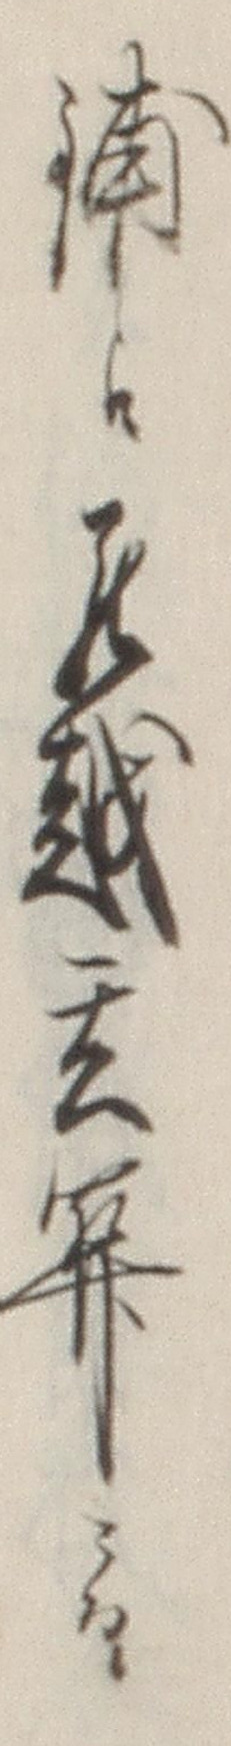鋪え罷越玄関ニ而
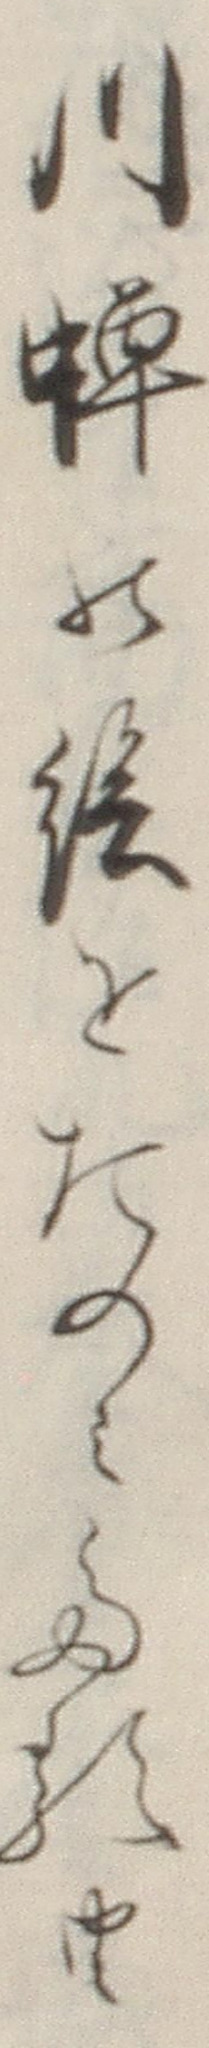川蝉の絵をたのミたる由
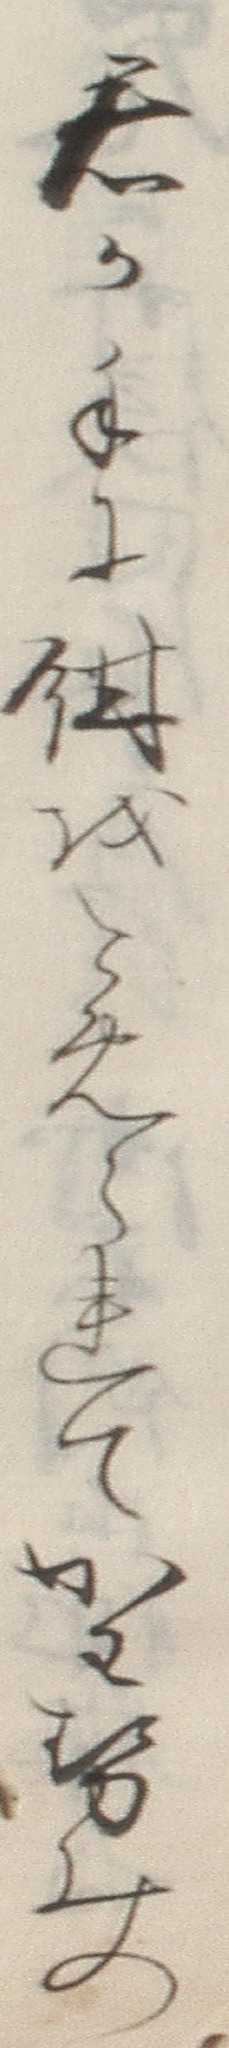君か手に餌をと見られてかわせみの
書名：[諸国災害記録]
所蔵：東京大学地震研究所図書室 Earthquake Research Institute Library, The University of Tokyo, JAPAN
